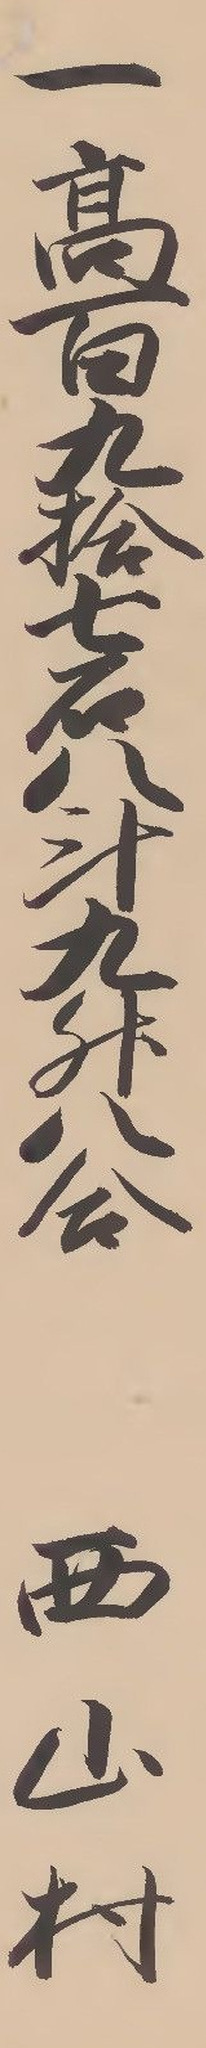一高百九拾七石八斗九升八合西山村
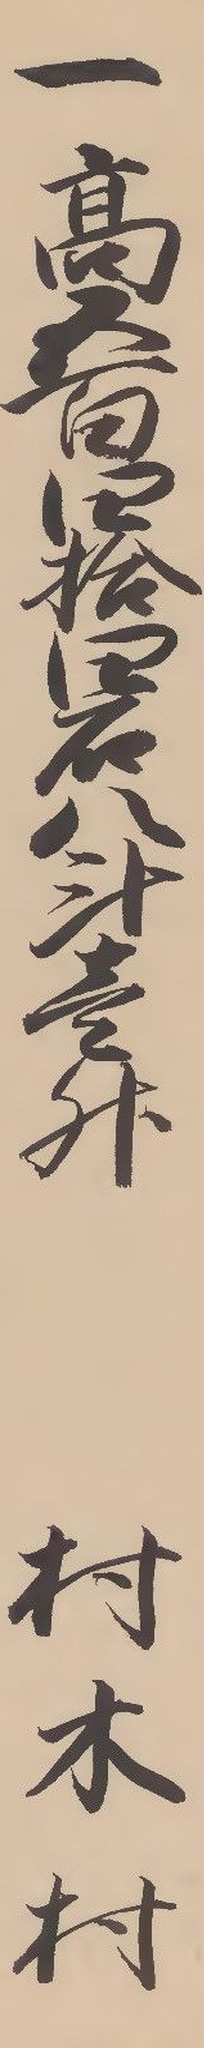一高五百四拾四石八斗壱升村木村
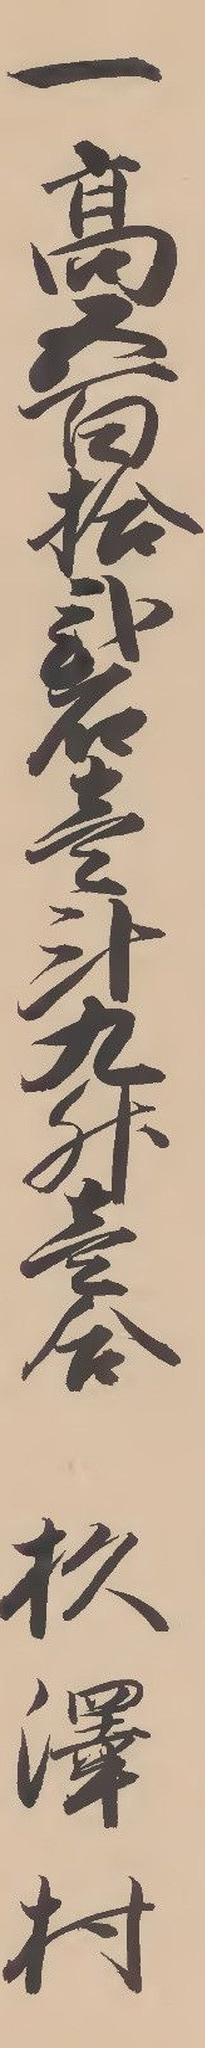一高五百拾弐石壱斗九升壱合杉沢村
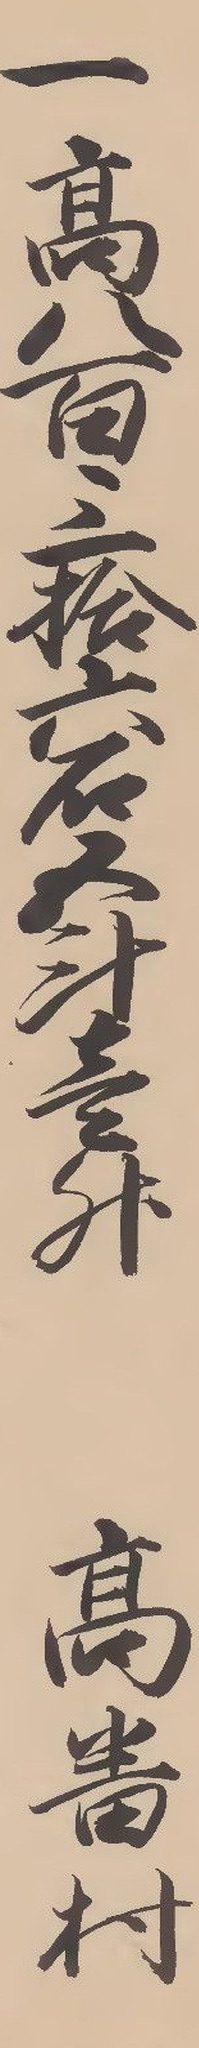一高八百三拾六石五斗壱升高番村
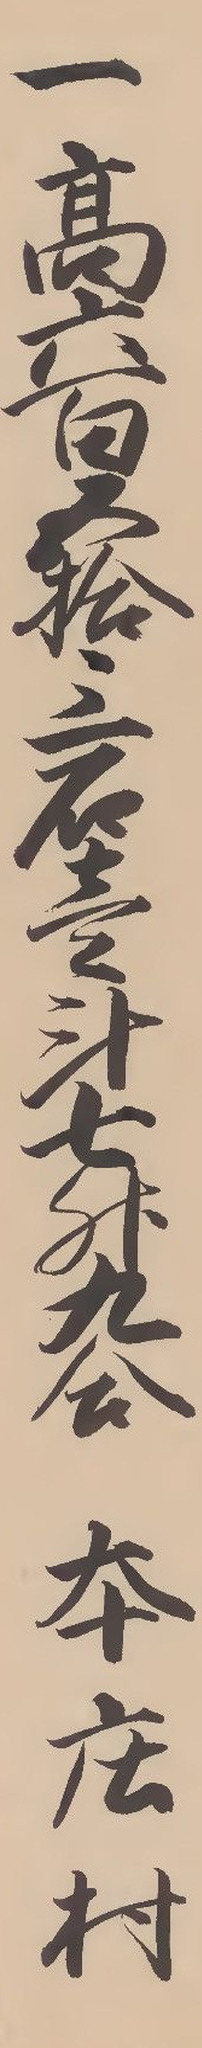一高六百五拾三石壱斗七升九合本庄村
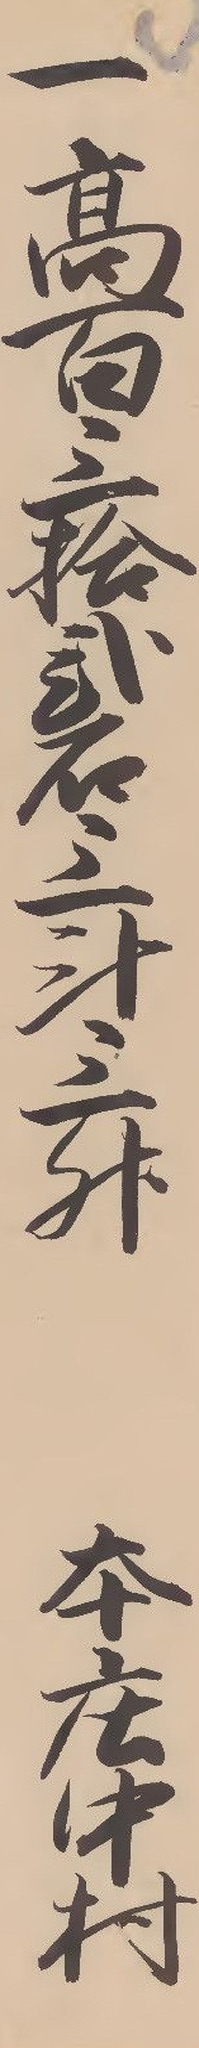一高百三拾弐石三斗三升本庄中村
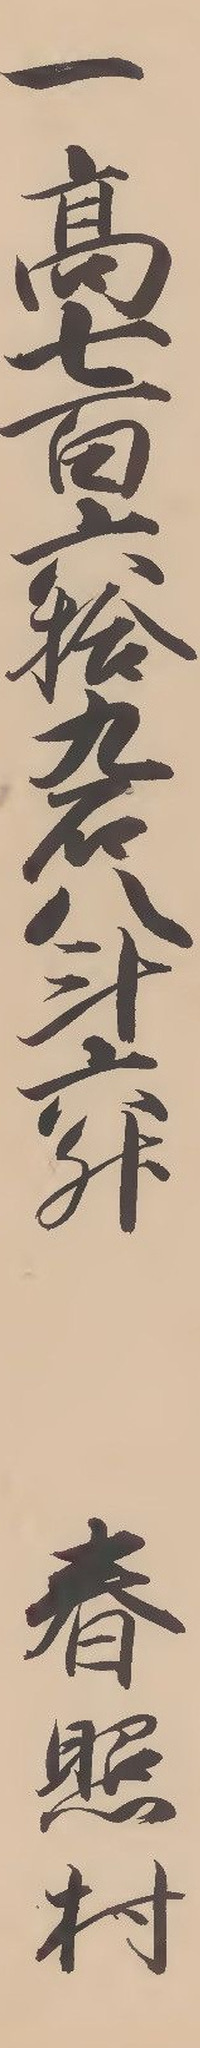一高七百六拾九石八斗六升春照村

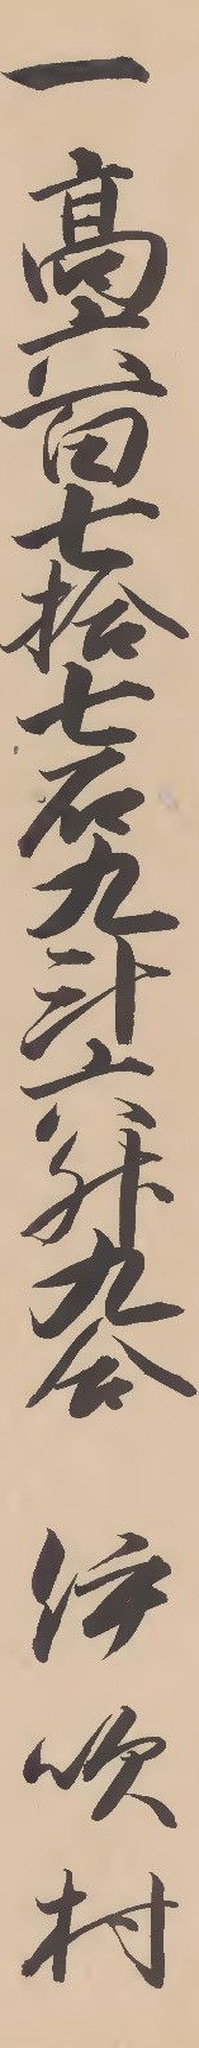一高六百七拾七石九斗六升九合伊吹村
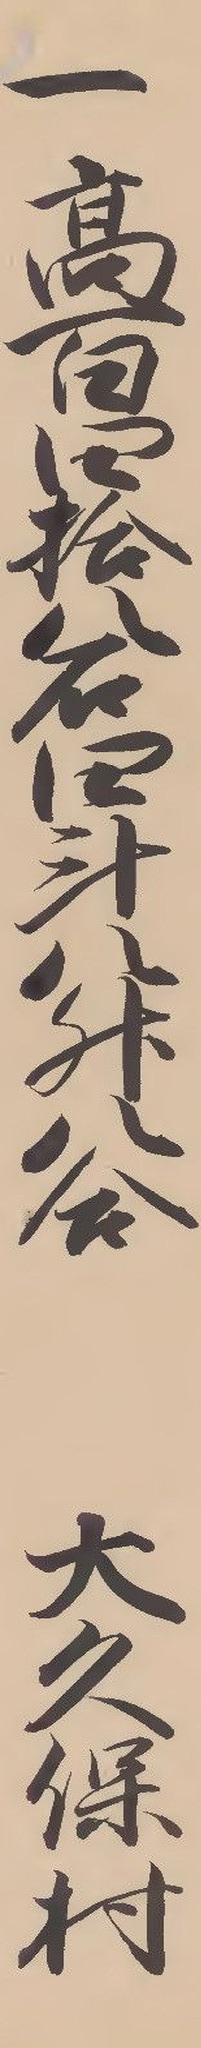一高百四拾八石四斗八升八合大久保村
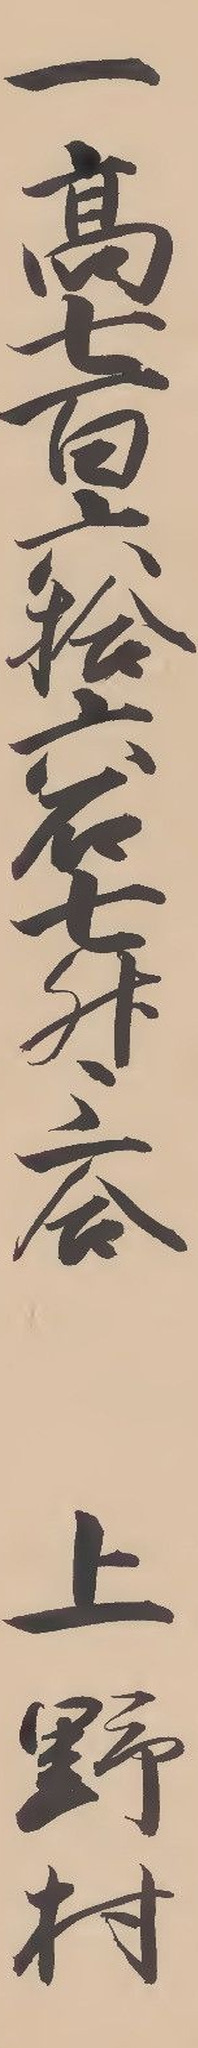一高七百六拾六石七升三合上野村
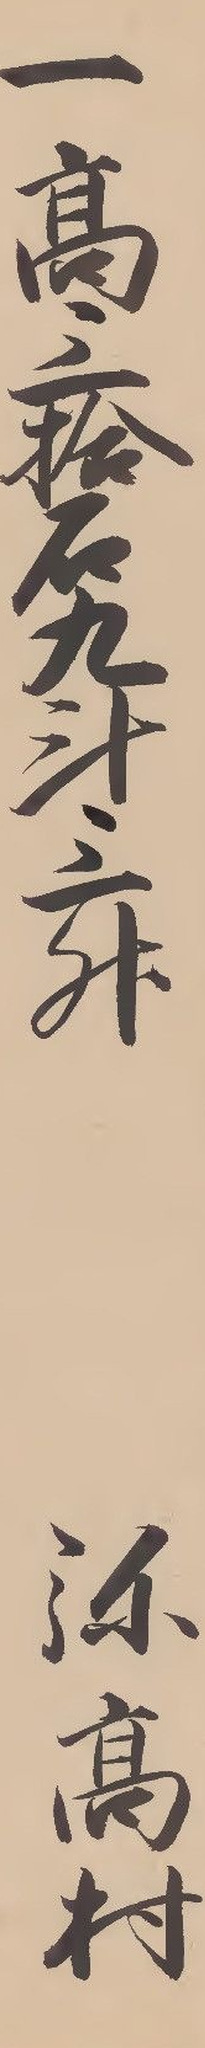一高三拾石九斗三升弥高村
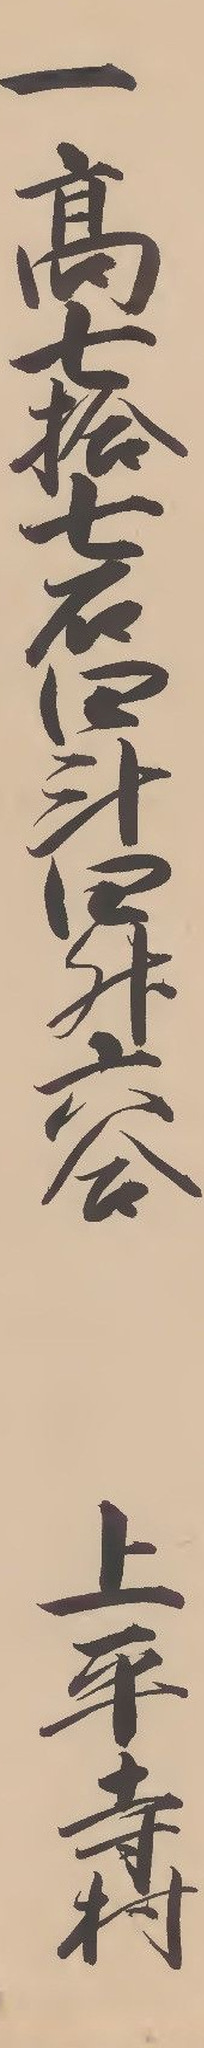一高七拾七石四斗四升六合上平寺村
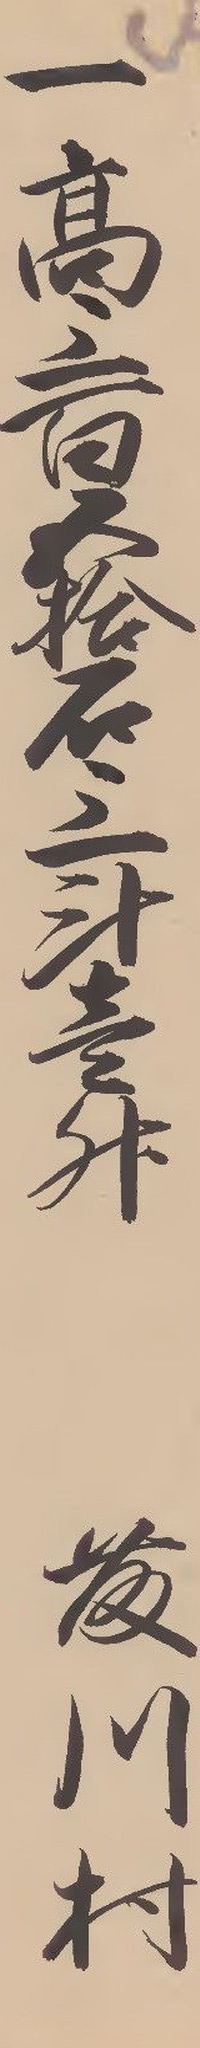一高三百五拾石三斗壱升藤川村

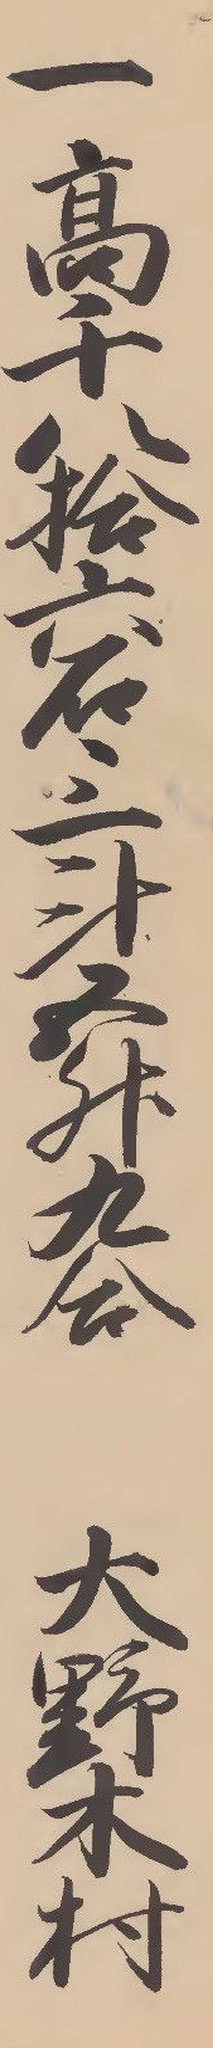一高千八拾六石三斗五升九合大野木村
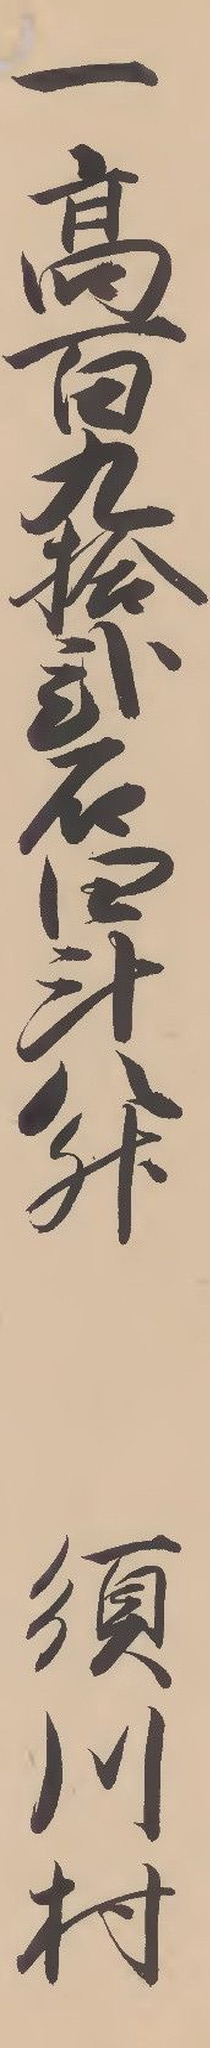一高百九拾弐石四斗八升須川村
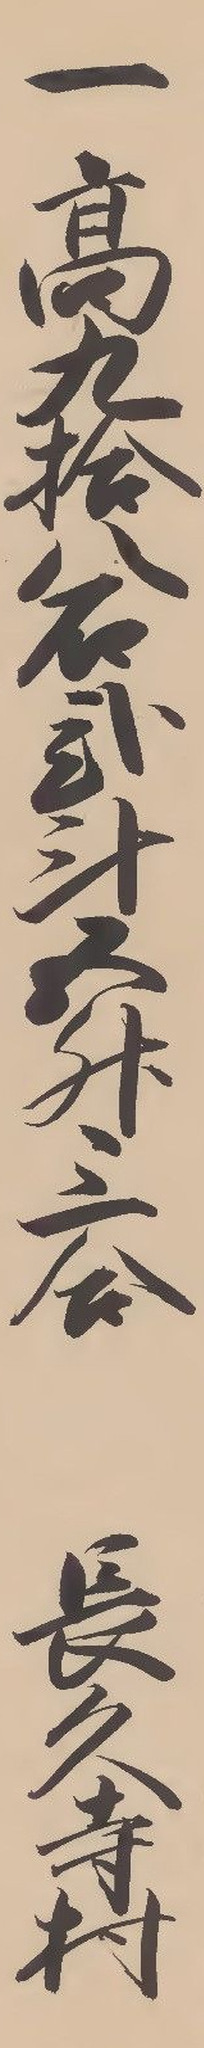一高九拾八石弐斗五升三合長久寺村
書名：近江国郷帳
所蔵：国立公文書館 National Archives of Japan
